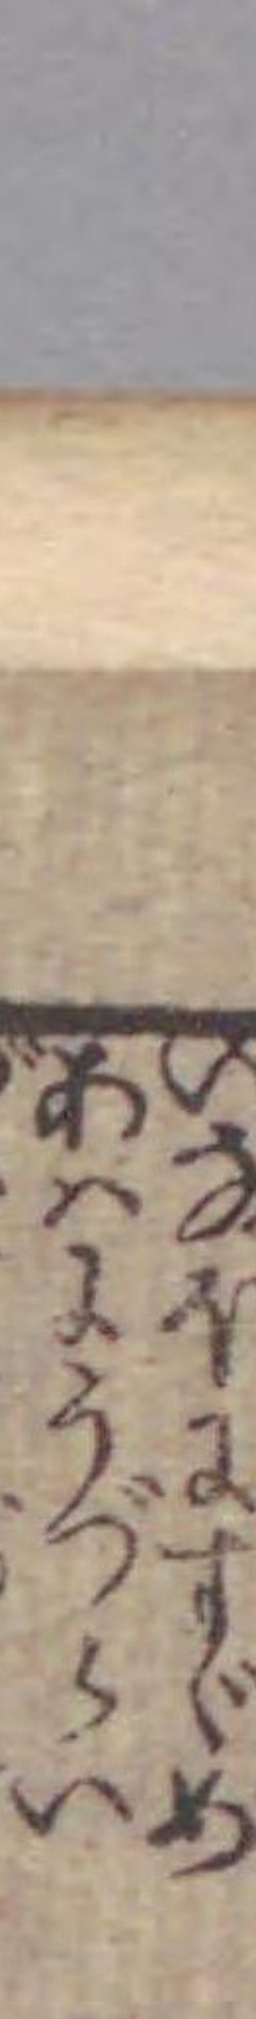あはにうづらい
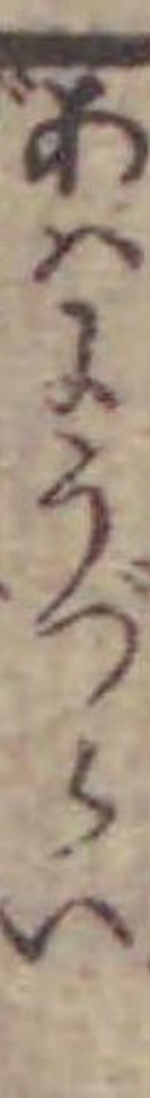あはにうづらい
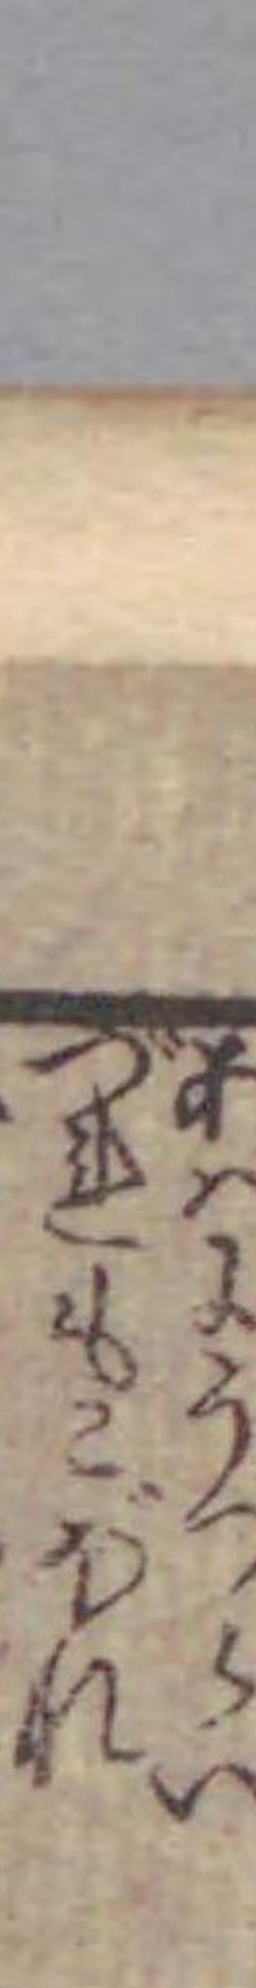つれもこぼれ
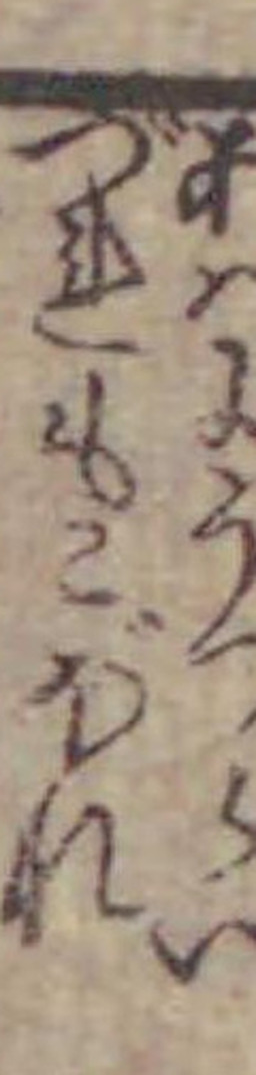つれもこぼれ
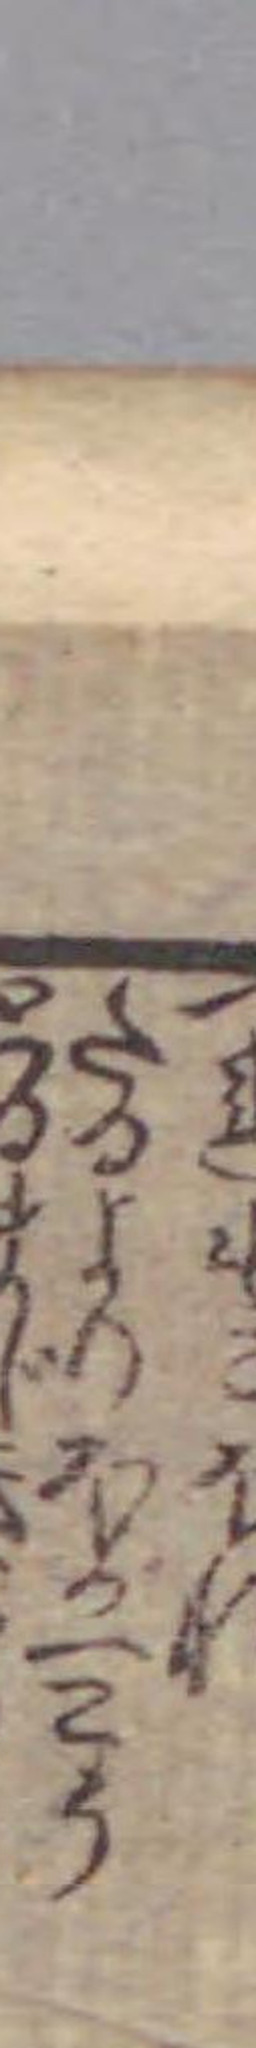たるよりほが一こう
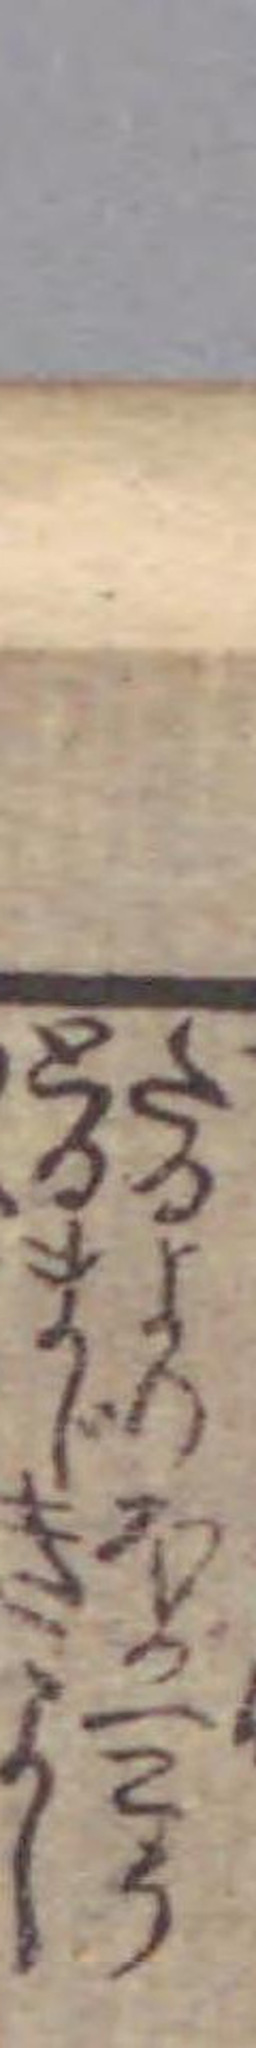とるまじきよし
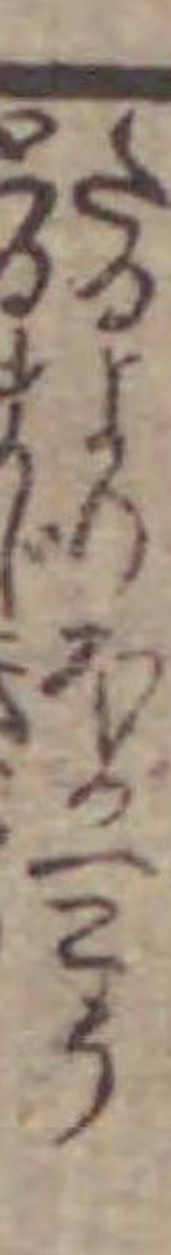たるよりほが一こう
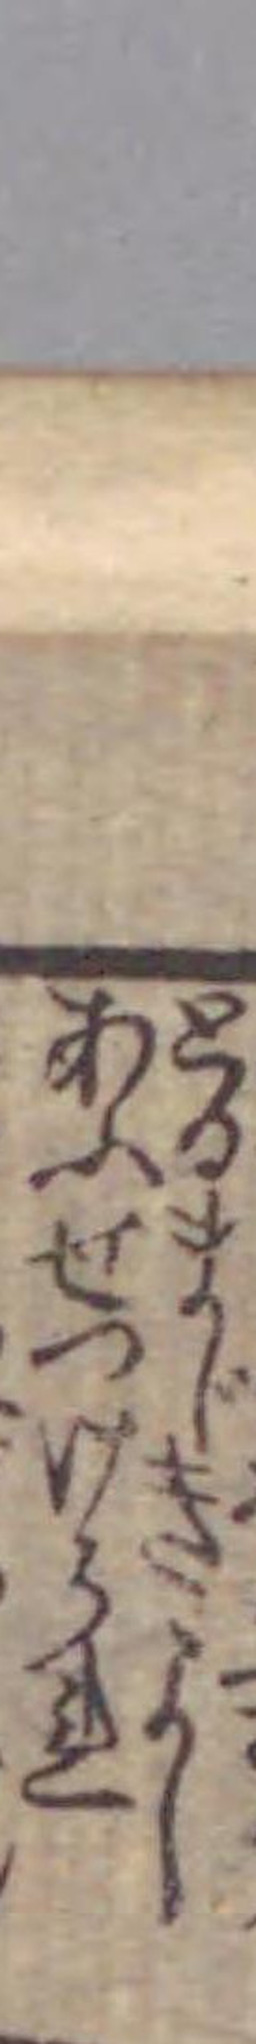あふせつけられ
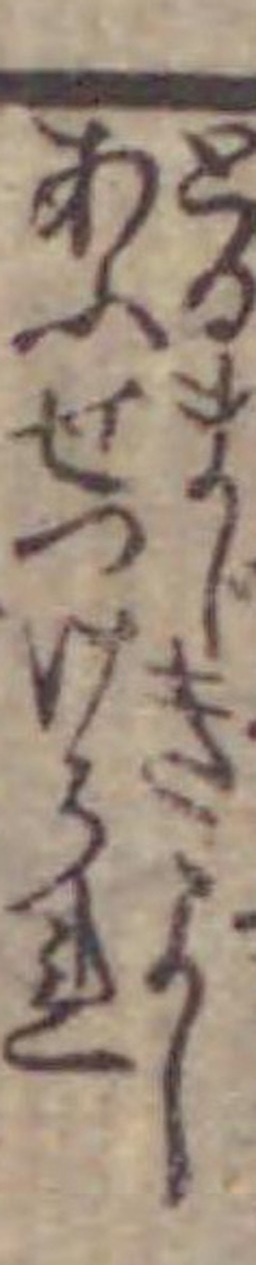あふせつけられ
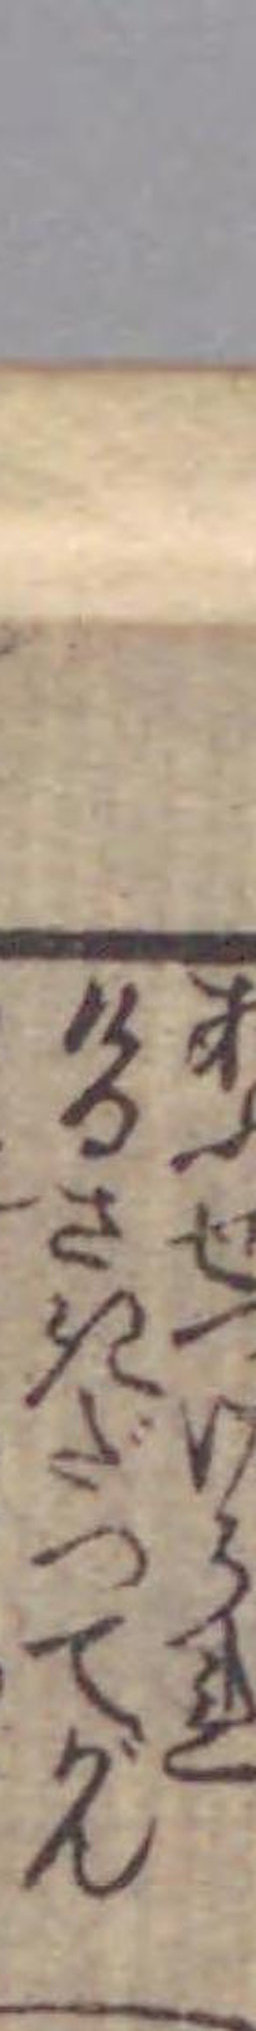けるさきだつてがん
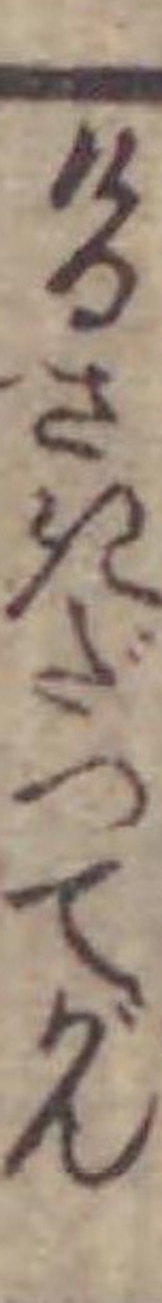けるさきだつてがん
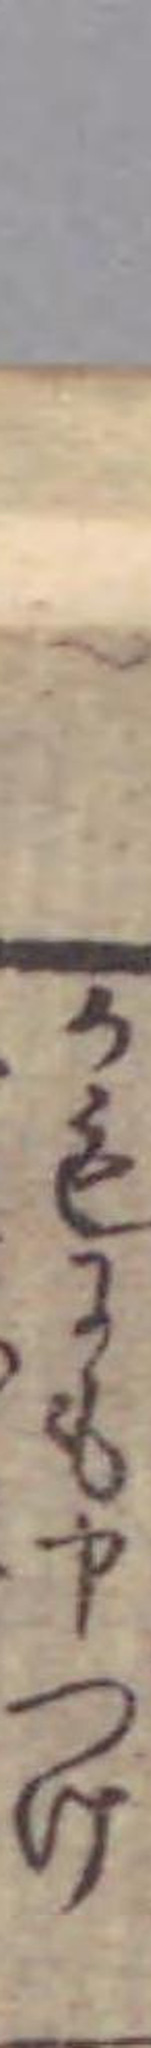かもにも申つけ
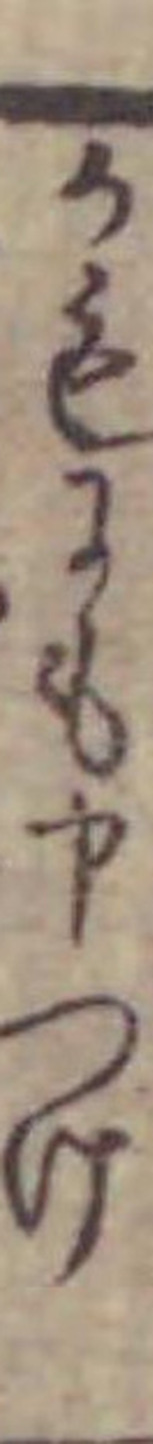かもにも申つけ
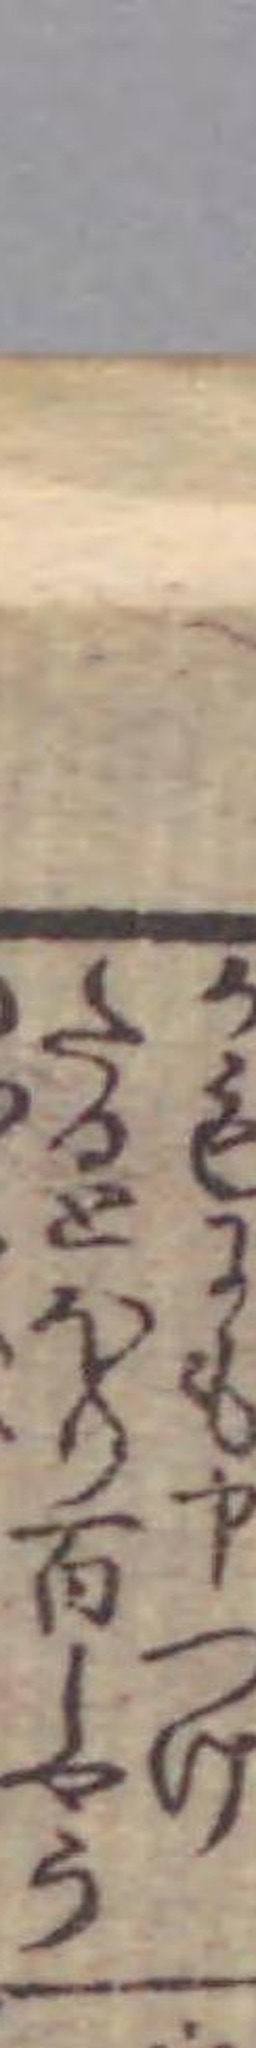たるとほり百しゃう
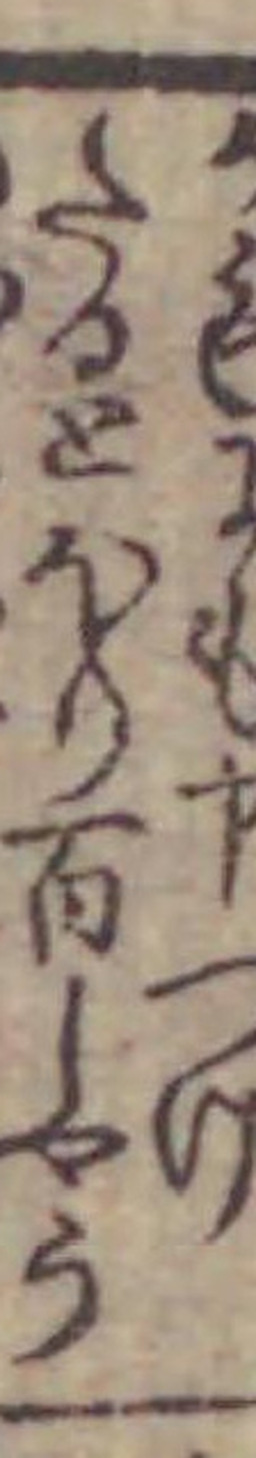たるとほり百しゃう
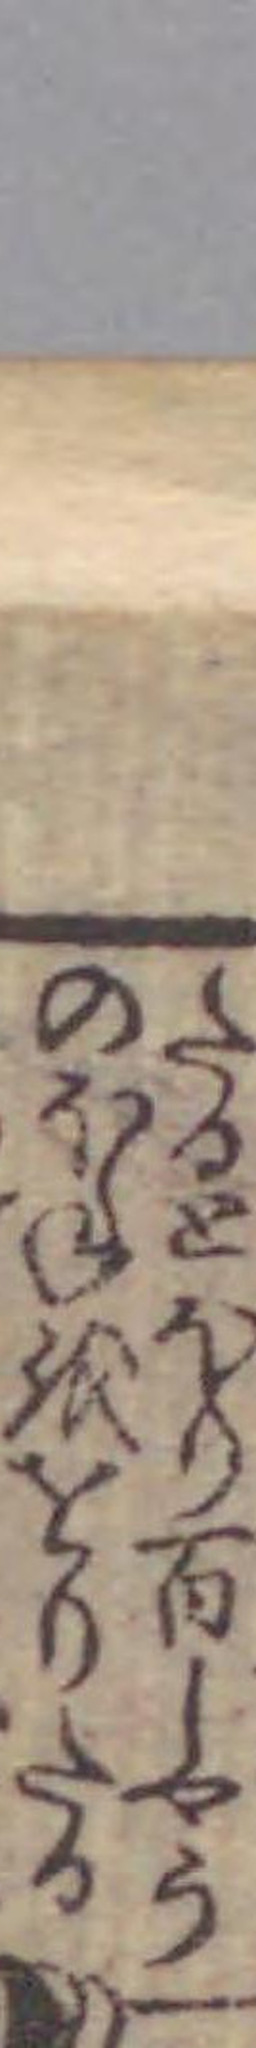のほねをとりたる
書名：即席耳学問 : 3巻
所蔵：国立国会図書館 National Diet Library, JAPAN
